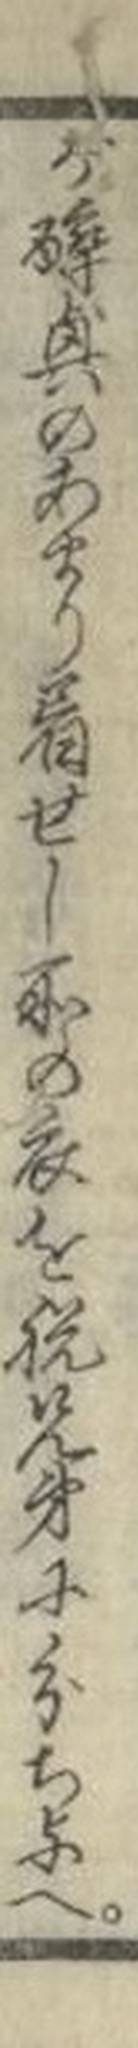が酔興のあまり着せし所の衣を脱兄弟に分ち与へ。
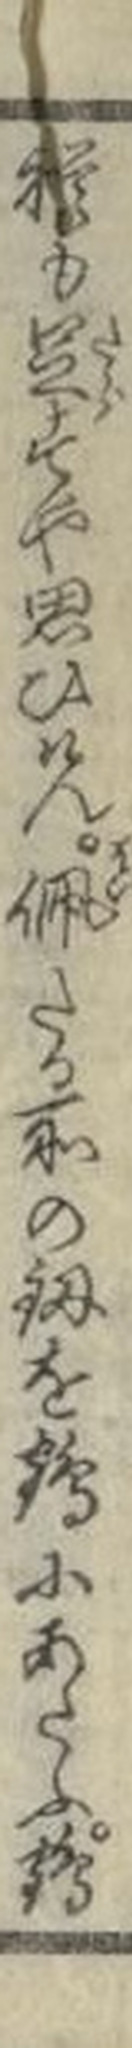も足すや思ひけん。佩たる所の剣を鶴にあたふ。鶴
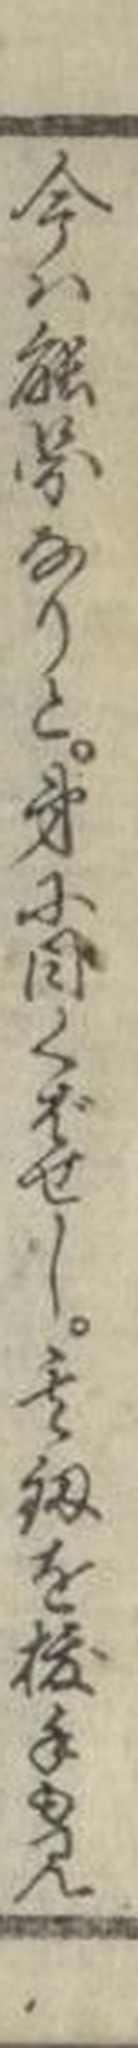今は能図なりと。弟に目くばせし。其剣を手も見
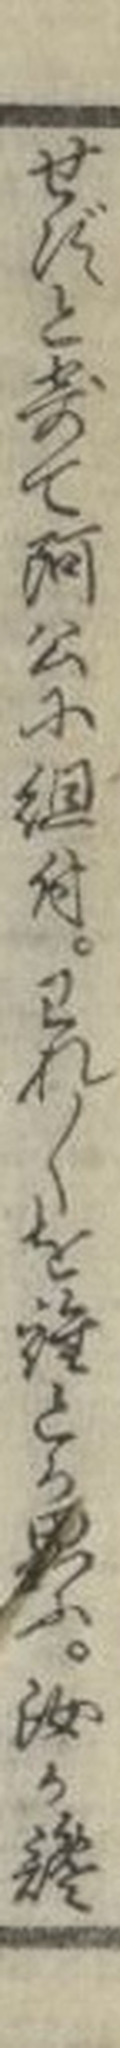せずと寄て阿公に組付。われ〳〵を誰とか思ふ。汝か讒
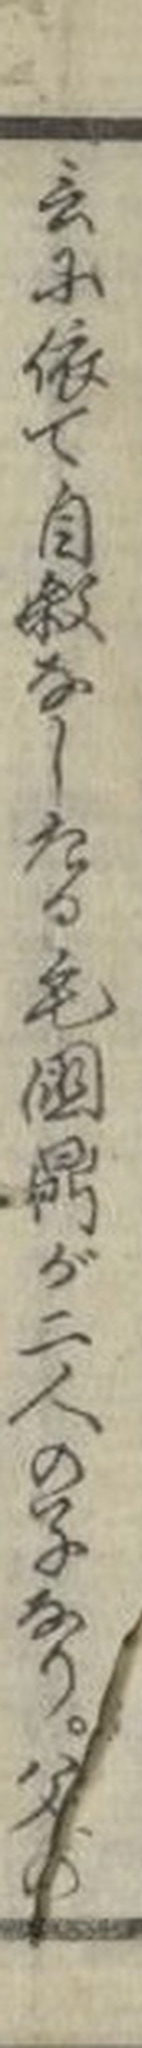言に依て自殺なしたる毛国鼎が二人の子なり。父の

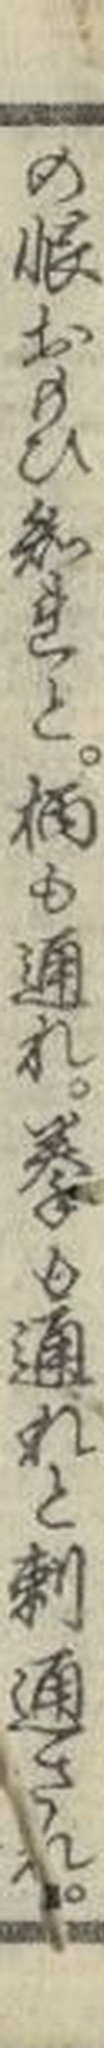の恨おもひ知れと。柄も通れ。拳も通れと刺通され。
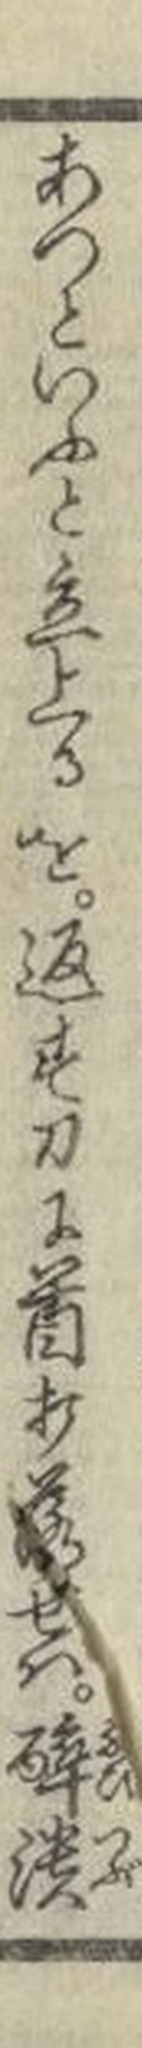あつといふと立上るを。返す刀に首打落せは。酔潰
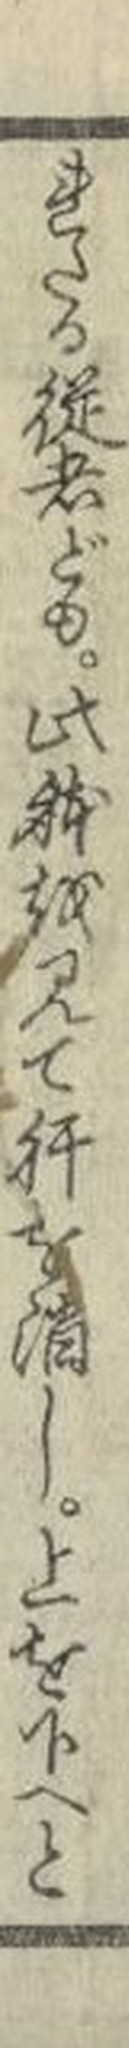れたる従者ども。此躰を見て肝を潰し。上を下へと
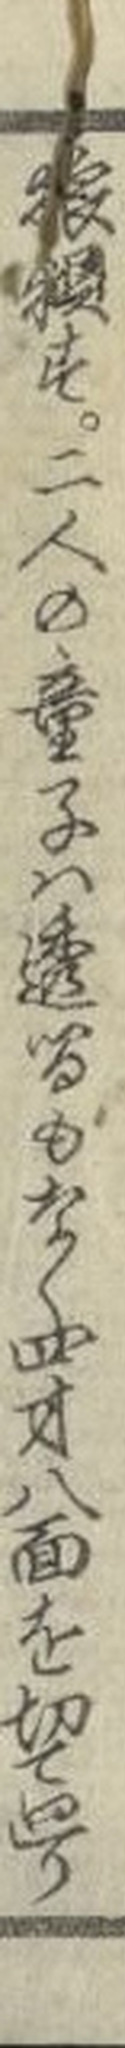狼狽す。二人の童子は透間もなく四才八面を切て廻り
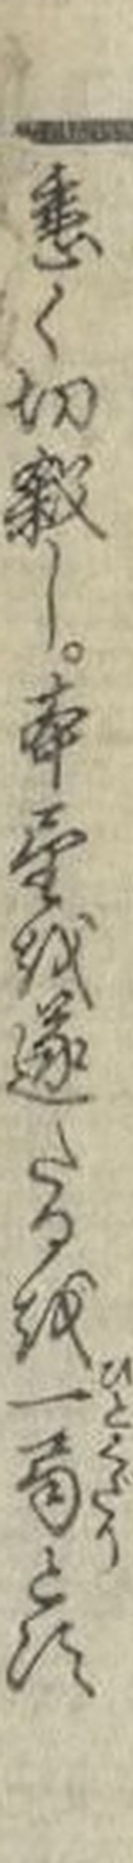悉く切殺し。本望を遂たるを一局とす
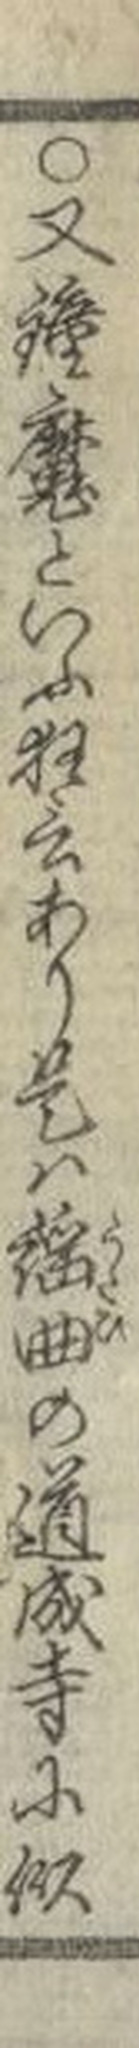○又鐘魔といふ狂言あり是は謡曲の道成寺に似
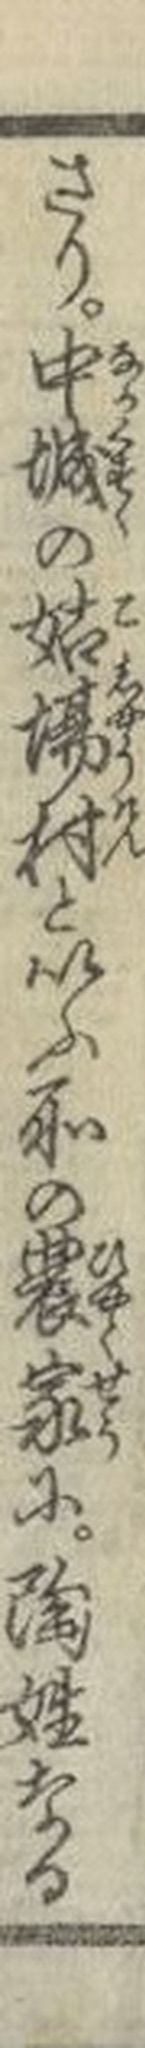たり。中城の姑場村といふ所の農家に。陶姓なる
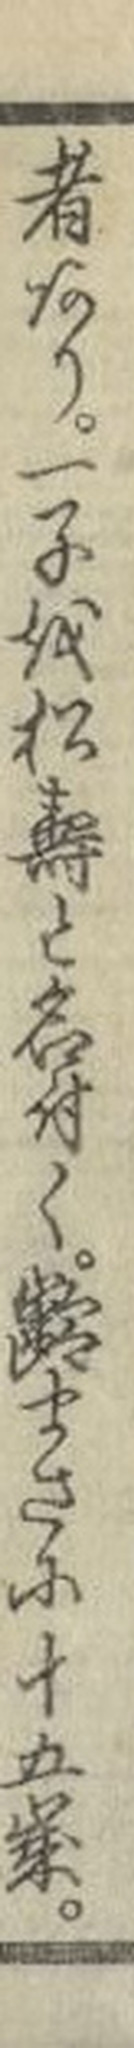者あり。一子を松寿と名付く。齢まさに十五歳。
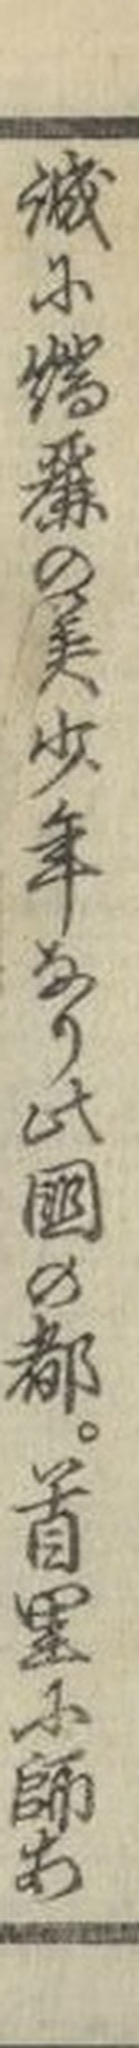誠に端麗の美少年なり此国の都。首里に師あ
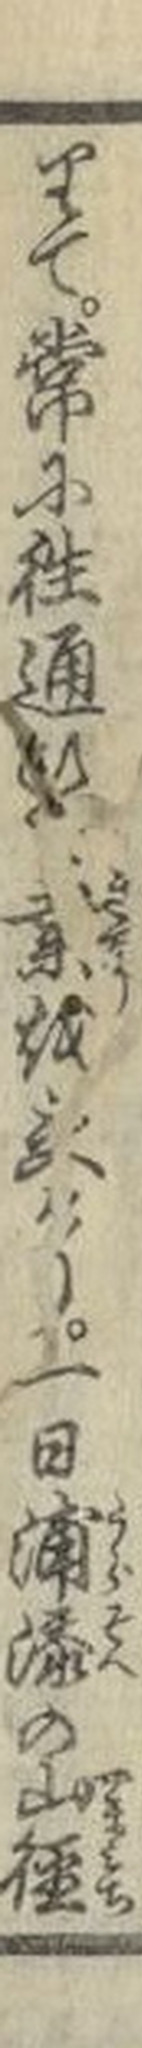りて。常に徃通ひ業をり。一日浦添の山径
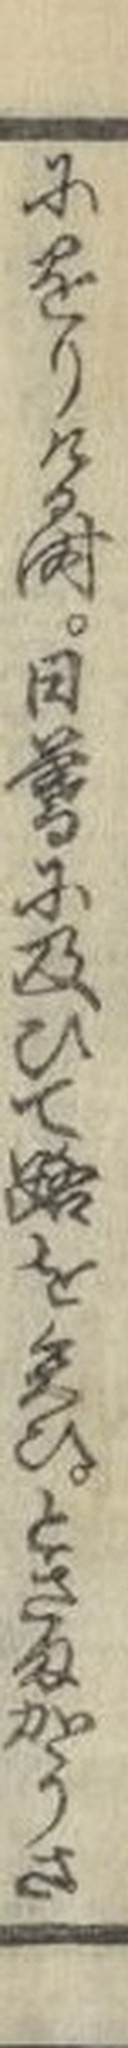にをりける時。日暮に及ひて路を失ひ。とさまかうさ
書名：琉球解語
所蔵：University of the Ryukyus Library
